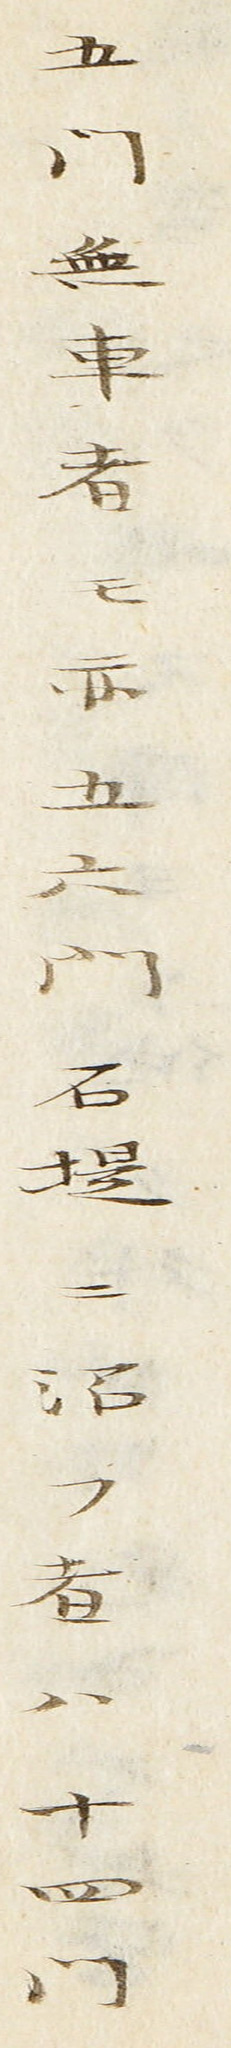五門無車者モ亦五六門石堤ニ沿フ者ハ十四門
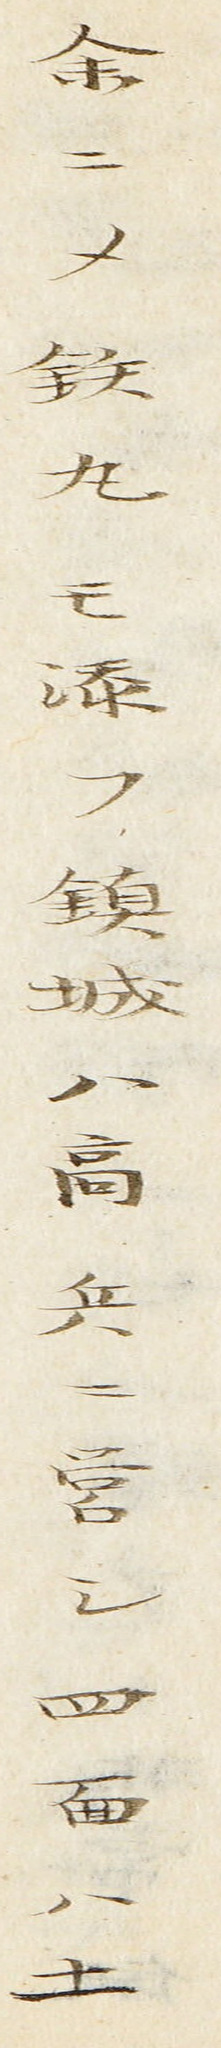余ニシテ鉄丸モ添フ鎮城ハ高兵ニ営シ四面ハ土
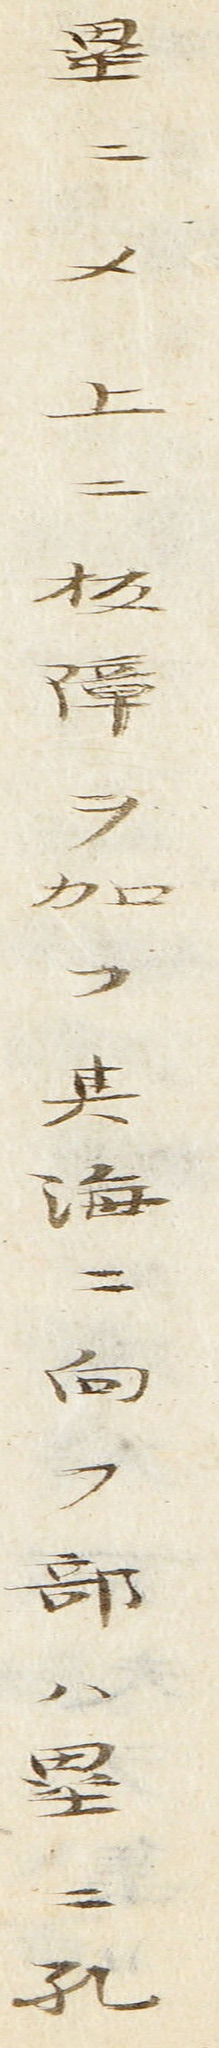塁ニシテ上ニ板障ヲ加フ其海ニ向フ部ハ塁ニ孔
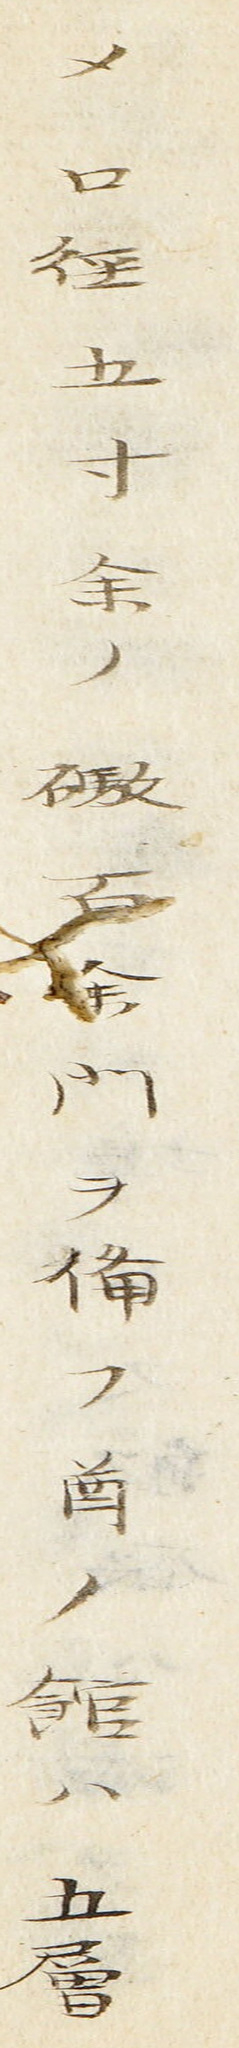シテ口径五寸余ノ礟百余門ヲ備フ酋ノ館ハ五層
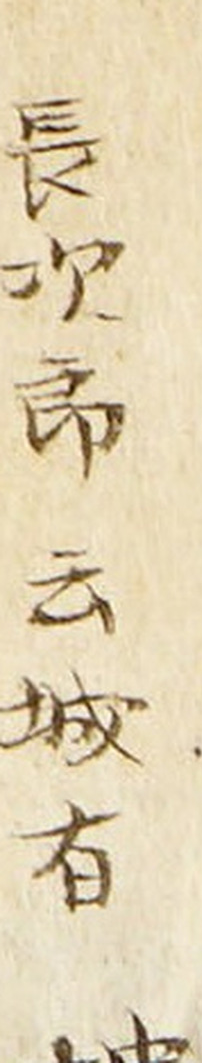長次郎云城有
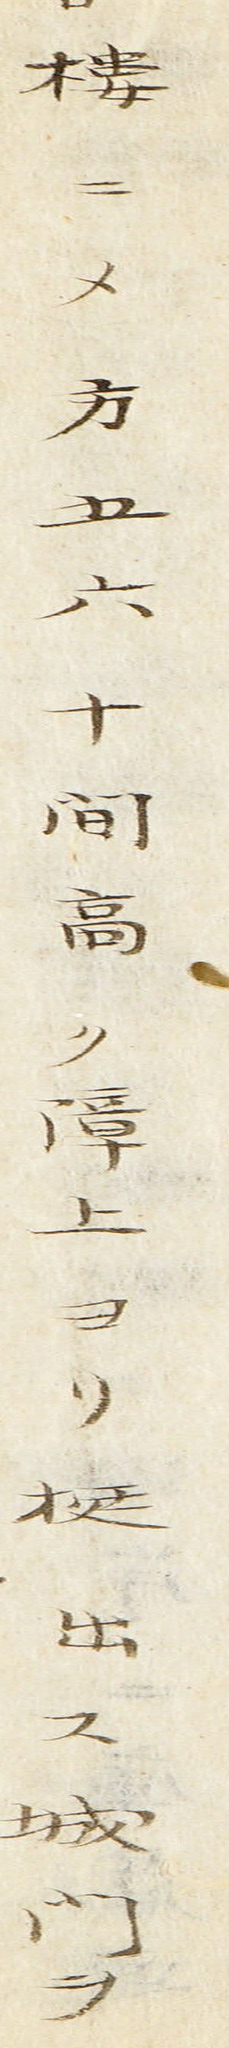楼ニシテ方五六十間高ク障上ヨリ挺出ス城門ヲ
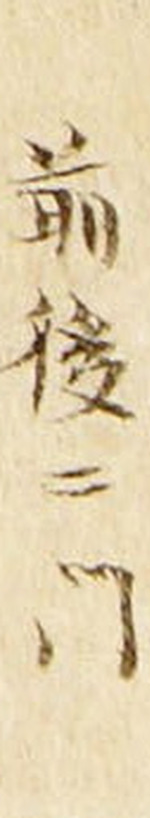前後ニ門
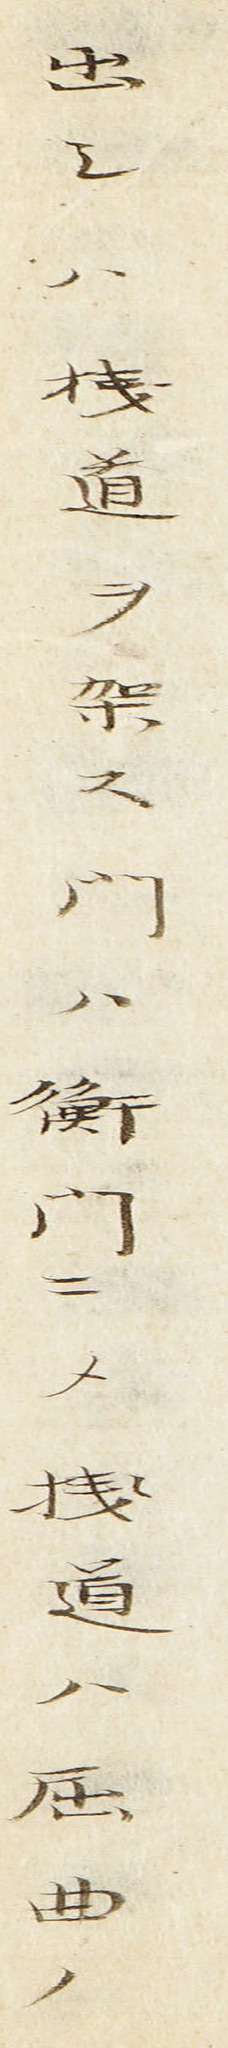出レハ桟道ヲ架ス門ハ衡門ニシテ桟道ハ屈曲ノ

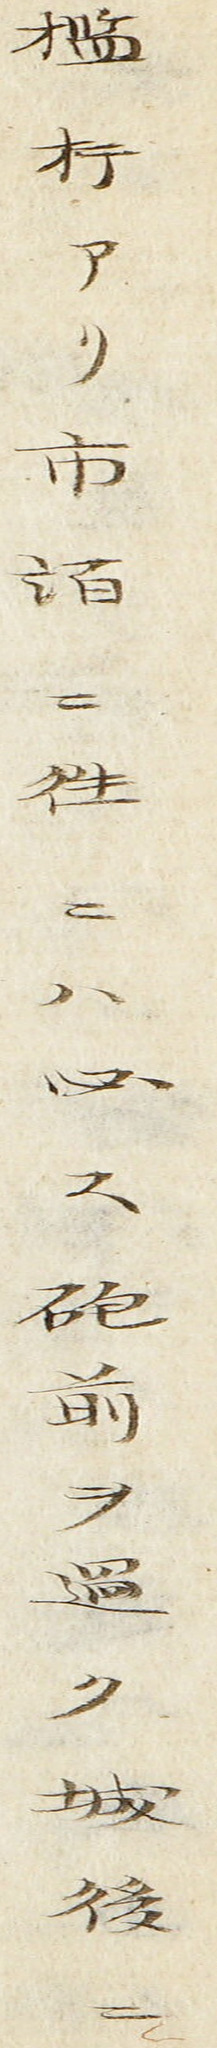檻杅アリ市絔ニ徃ニハ必ス砲前ヲ過ク城後ニ
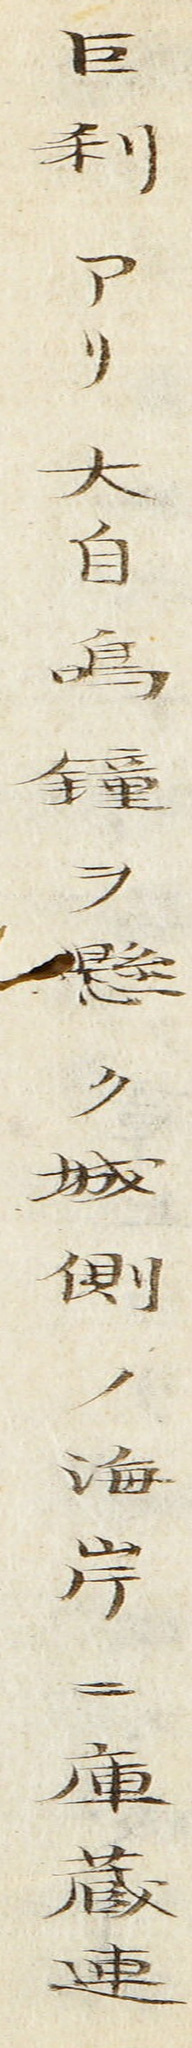巨利アリ大自鳴鐘ヲ懸ク城側ノ海岸ニ庫蔵連
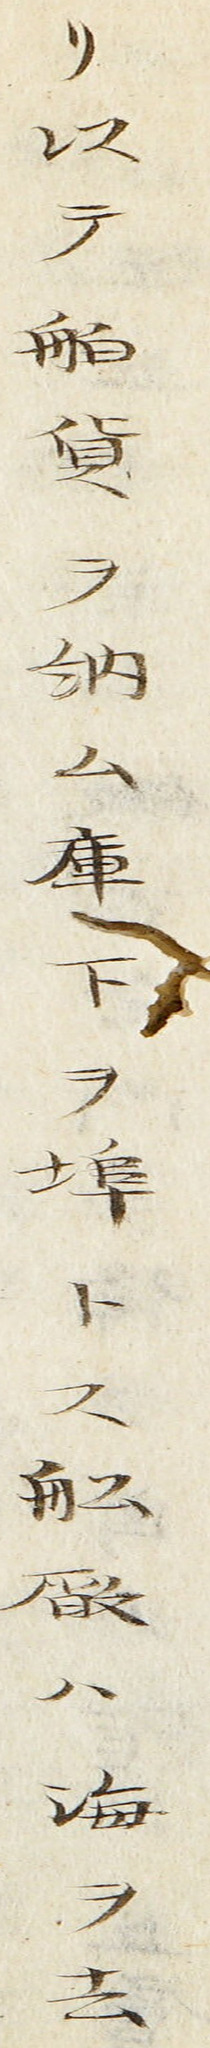リ以テ舶貨ヲ納ム庫下ヲ埠トス船厰ハ海ヲ去
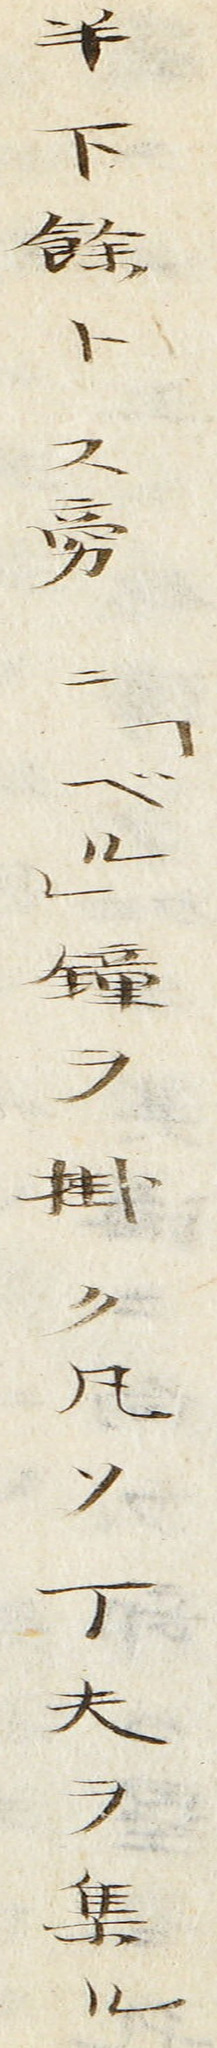半下余トス旁ニ「ベル」鐘ヲ掛ク凡ソ丁夫ヲ集ル
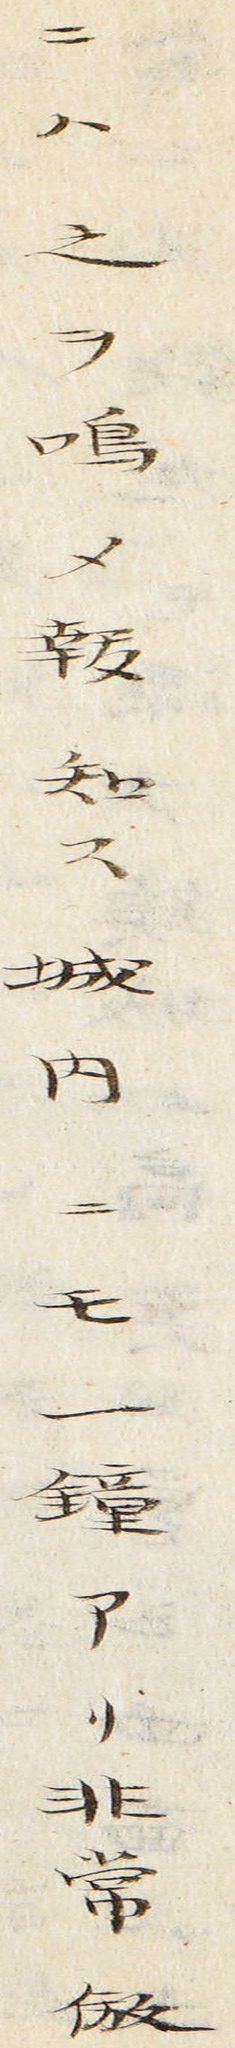ニハ之ヲ鳴シテ報知ス城内ニモ一鐘アリ非常倣
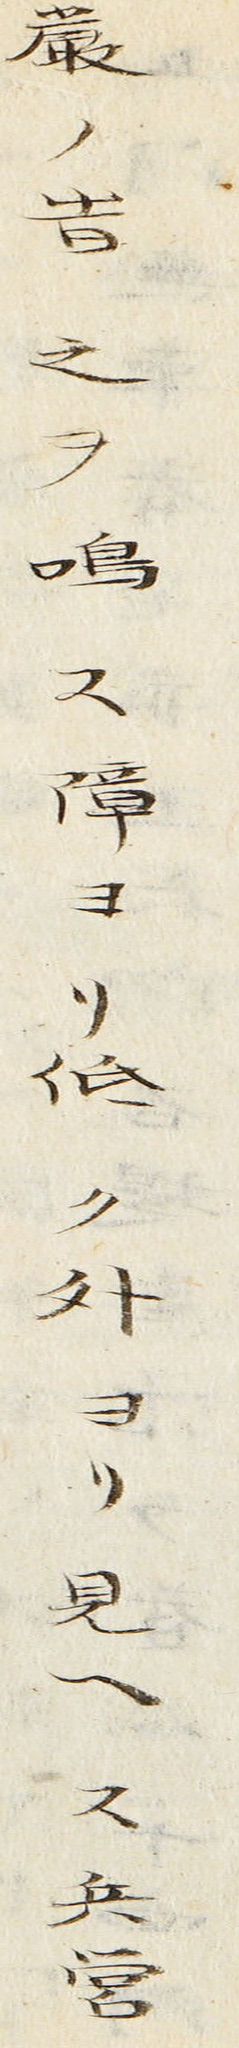厳ノ旹之ヲ鳴ス障ヨリ低ク外ヨリ見ヘス兵営
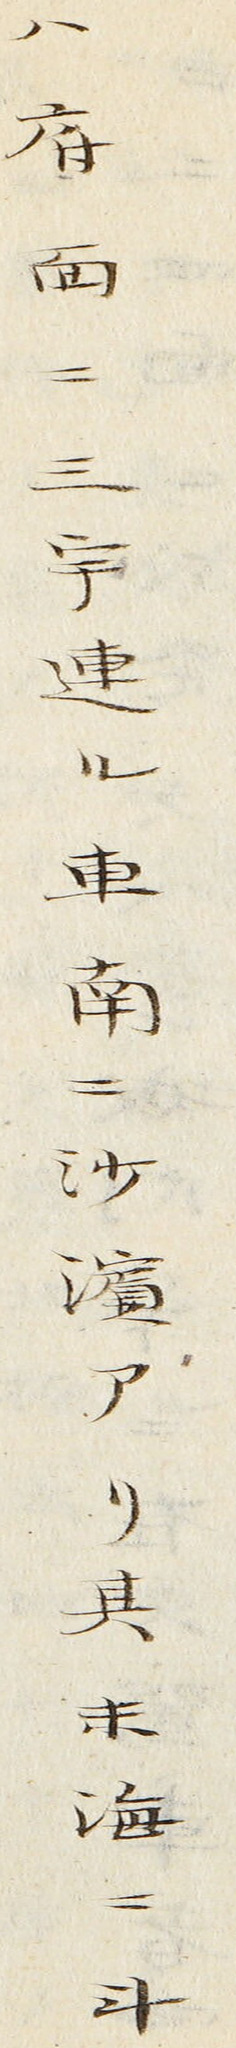ハ府面ニ三宇連ル東南ニ沙浜アリ其未海ニ斗
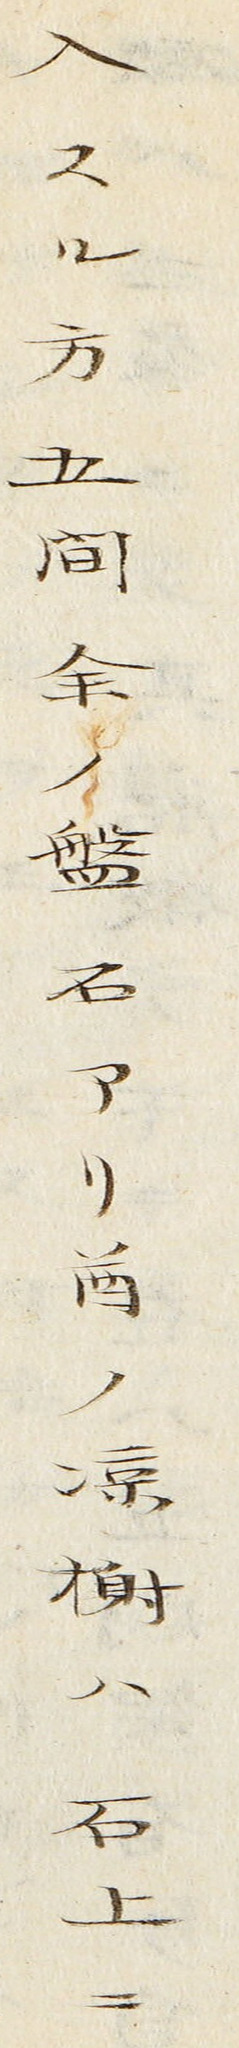入スル方五間余ノ盤石アリ酋ノ凉榭ハ石上ニ
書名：流蕃通書
